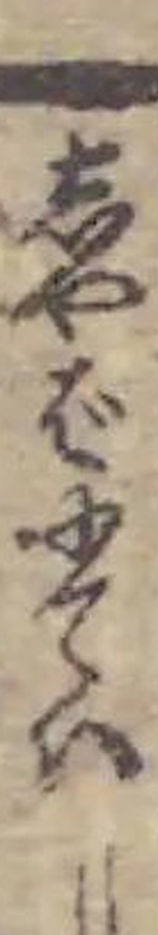しやばにて
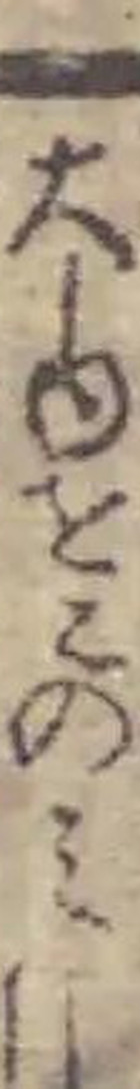大しゆをこのみ
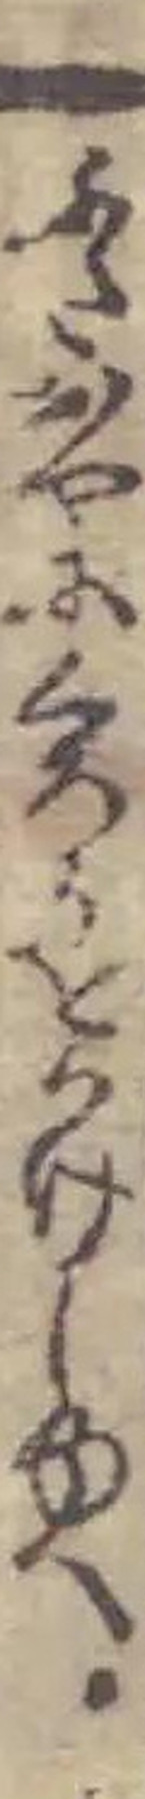ふたおやにくろうをかけしゆへ
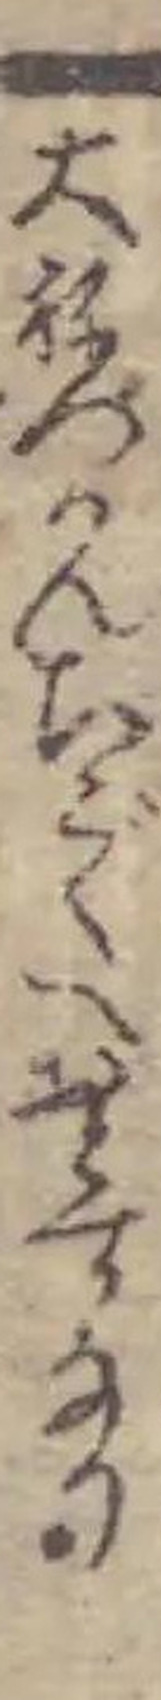大ねつかんちごくへおとすなり
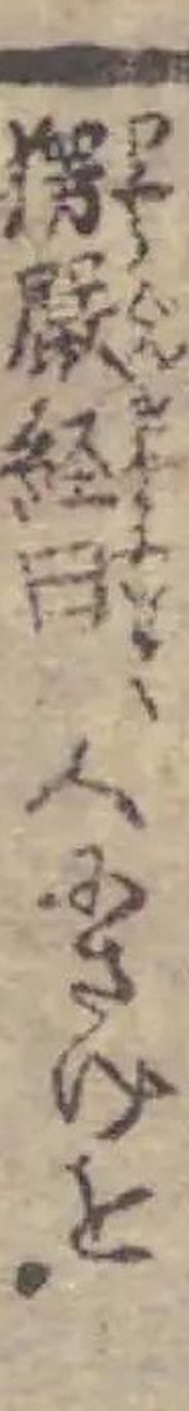楞厳経曰人にさけを
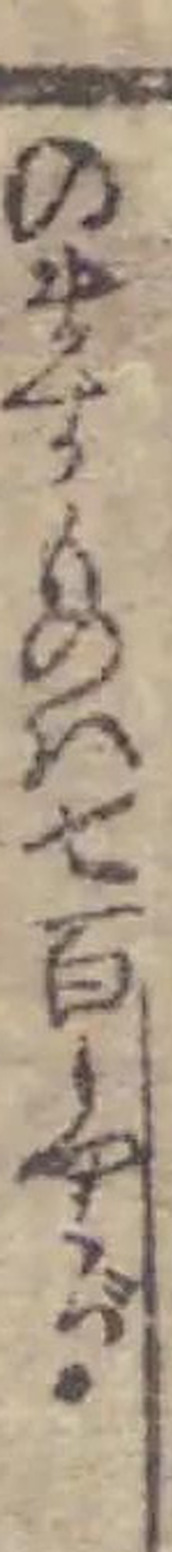のますものは七百しやうが
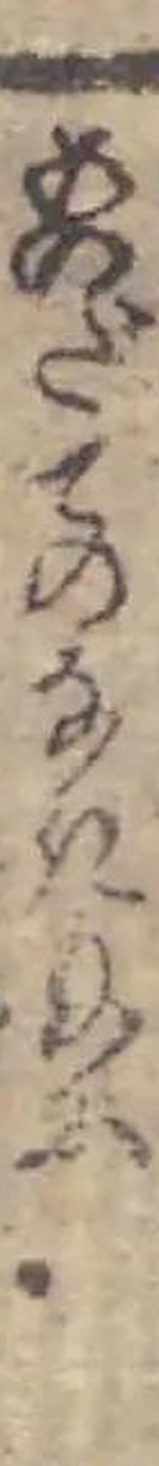あいだてのなきものに
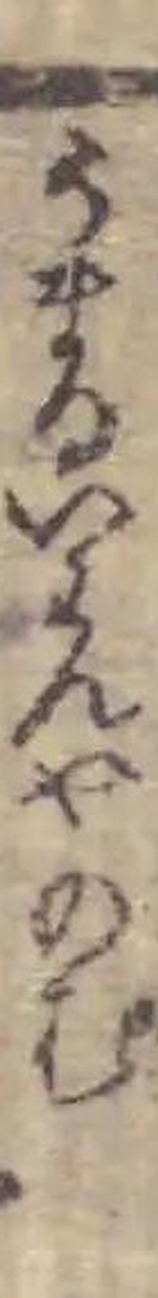うまるいわんやのむ
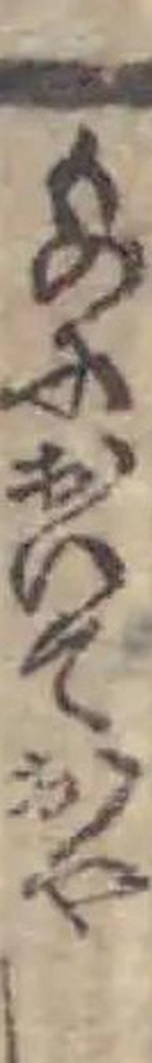ものにおいておや
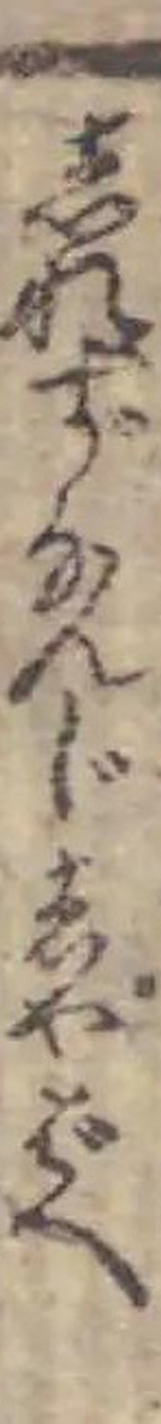しれずなんじしやばへ
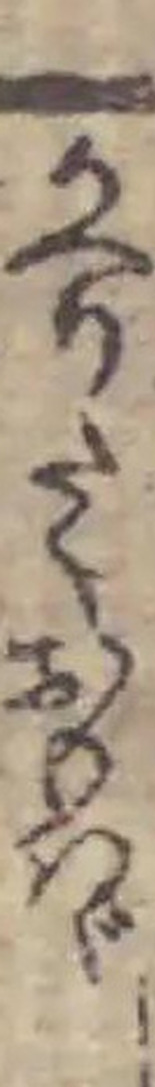かへりたくおもはゞ
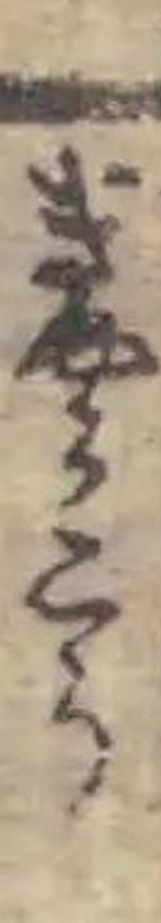ぎやうこう
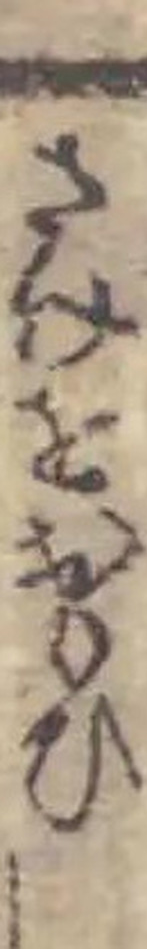さけをおもひ
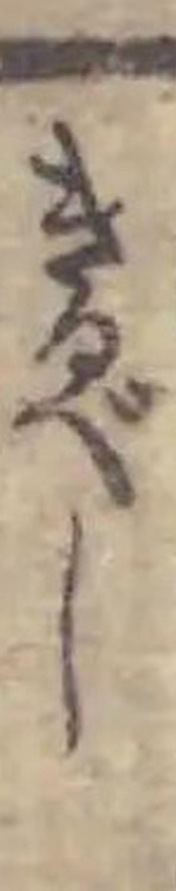きるべし
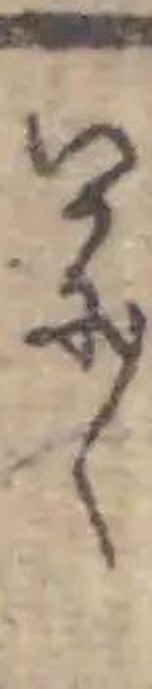いかに〳〵

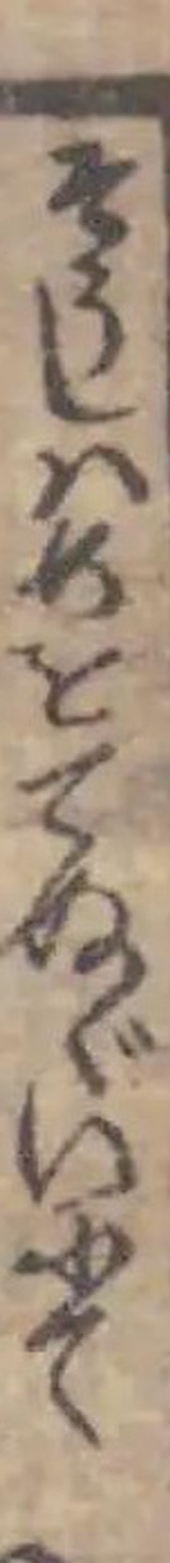そうしはめをてぬぐいにて
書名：飲中八人前 3巻
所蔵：国立国会図書館 National Diet Library, JAPAN
